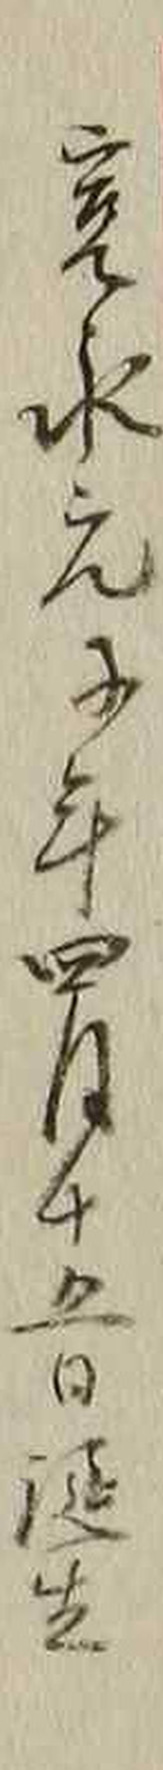寛永元子年四月十五日誕生
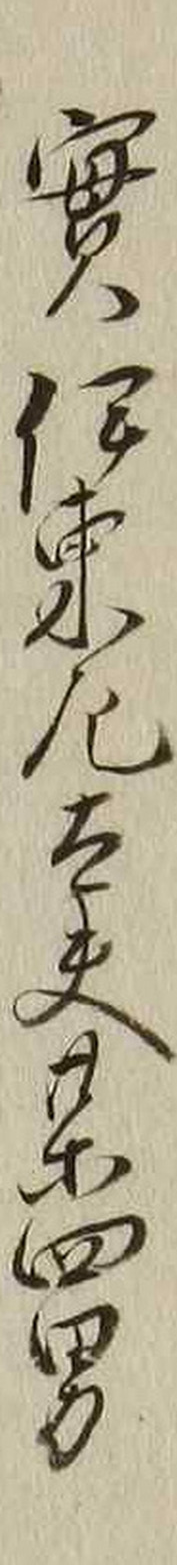実伊束左太夫某四男
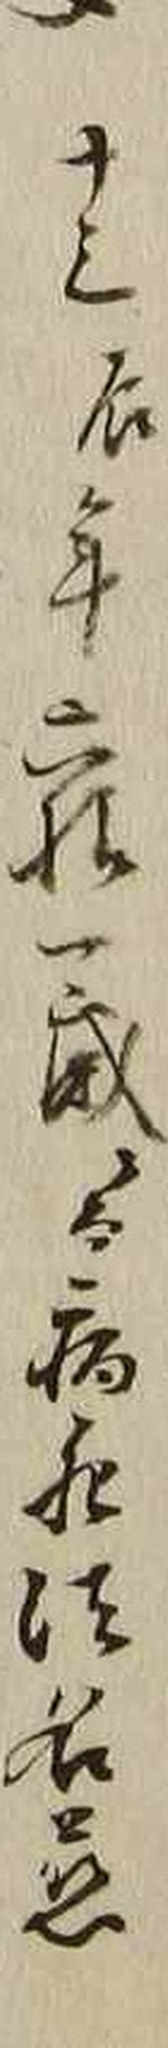十三辰年六拾一歳ニ而病死法名慈
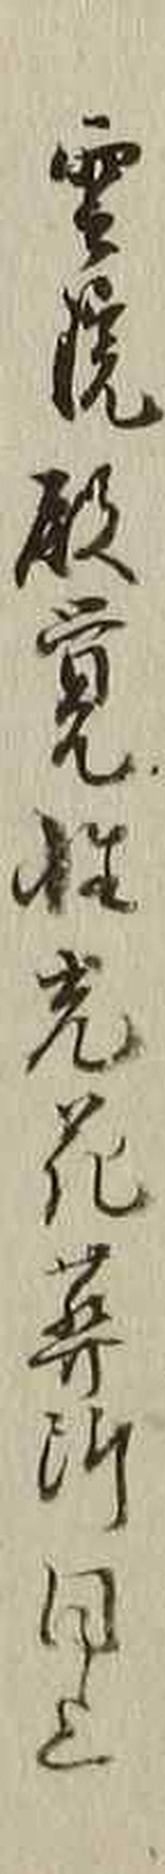雲院殿覚性光花葬所同上
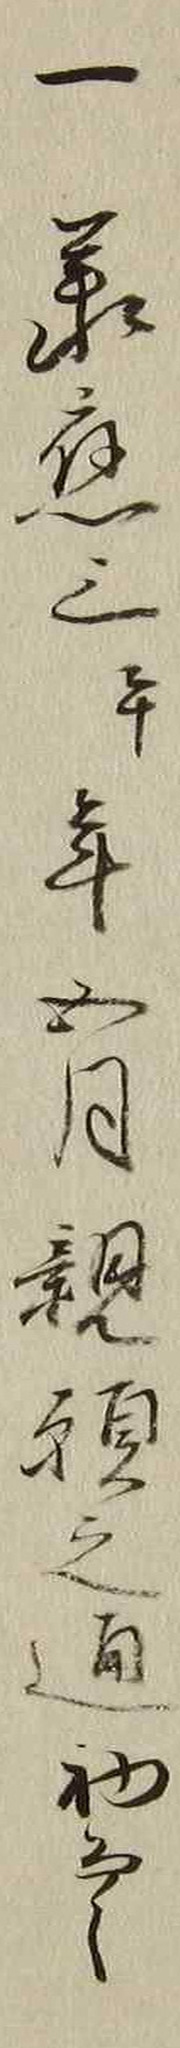一承応三午年五月親願之通初而之
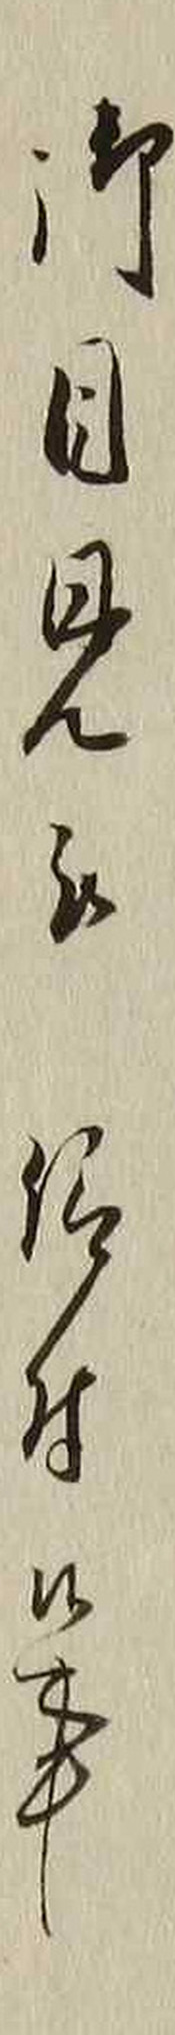御目見被仰付候事
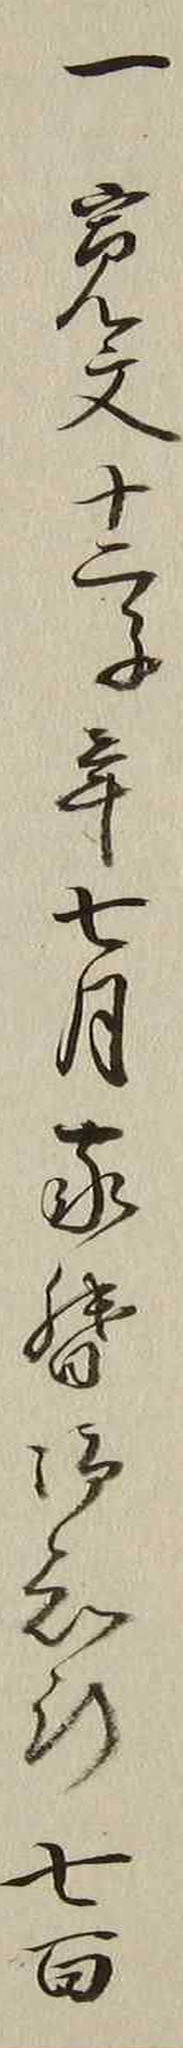一寛文十二子年七月家督御知行七百
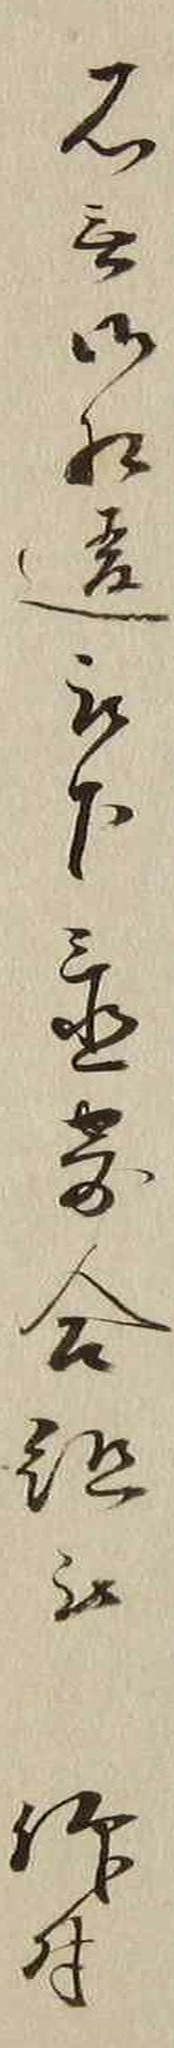石無御相違被下置寄合組被仰付
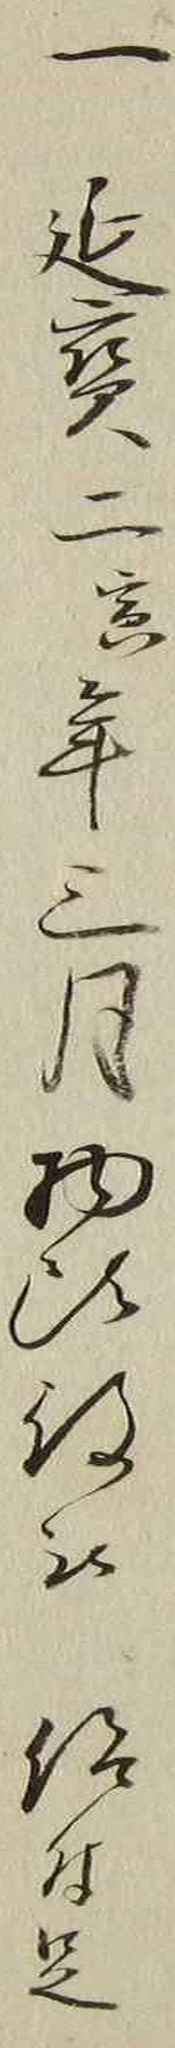一延宝二寅年三月物頭役被仰付足
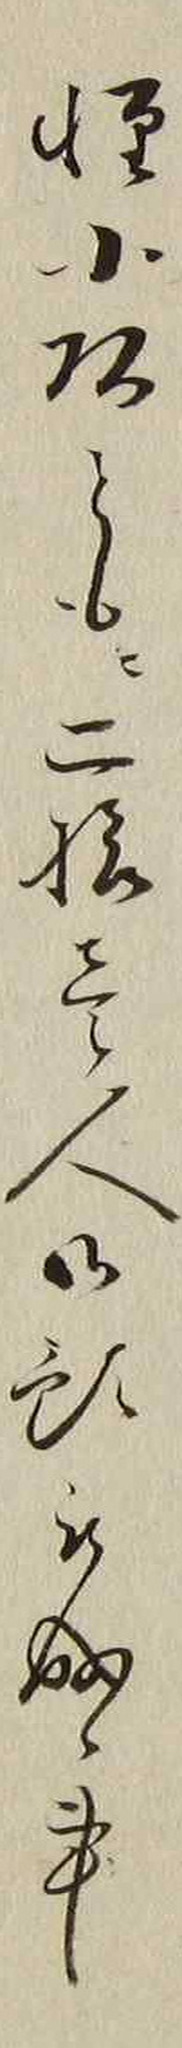軽小頭ともニ二拾壱人御預被成候事
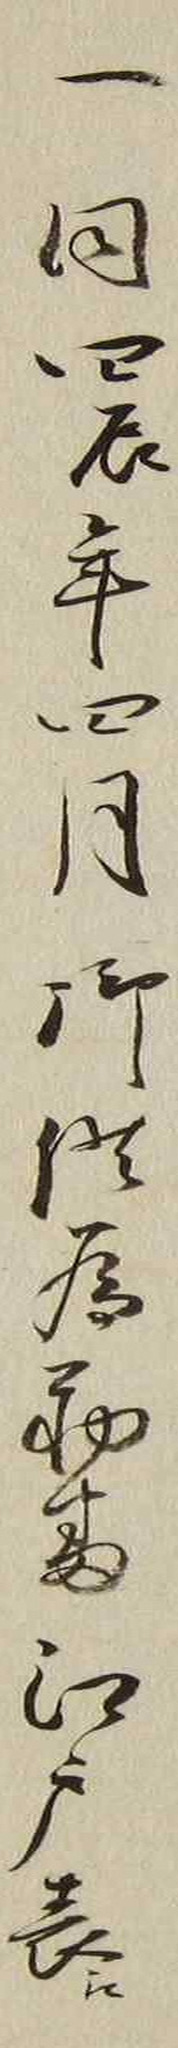一同四辰年四月御供為勤番江戸表江
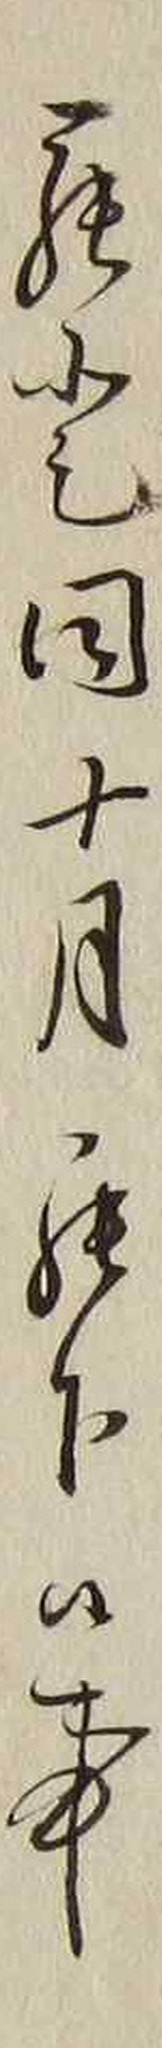罷登同十月罷下候事
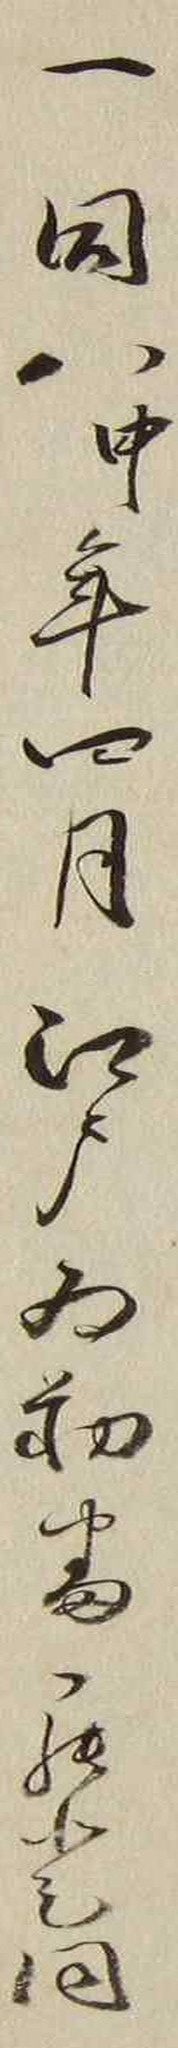一同八申年四月江戸為勤番罷登同
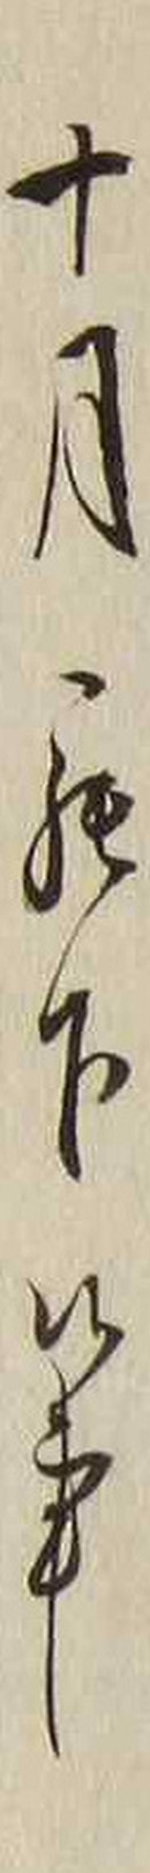十月罷下候事

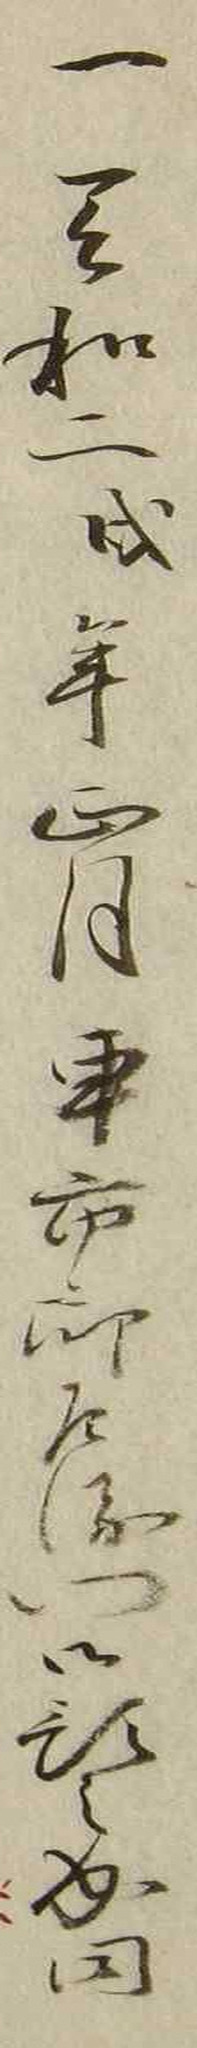一天和二戊年正月車市郎左衛門御預之同
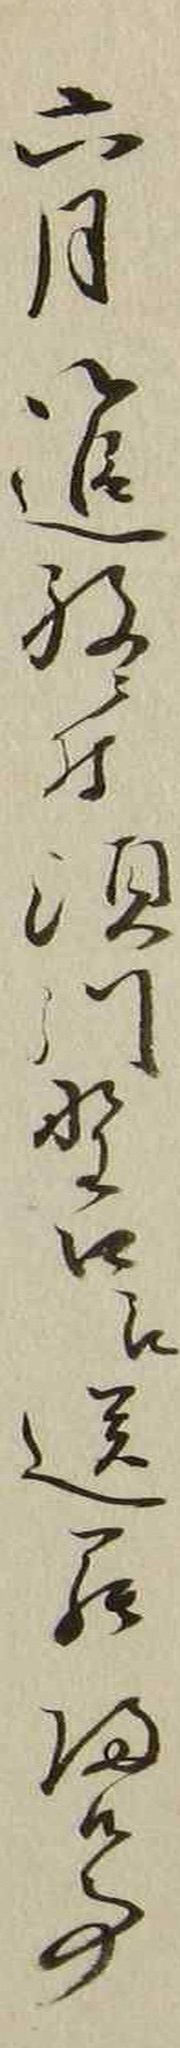六月御追放ニ付須川野口江送罷帰候事
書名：諸士系譜　巻之25　い之部25
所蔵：会津若松市立会津図書館
